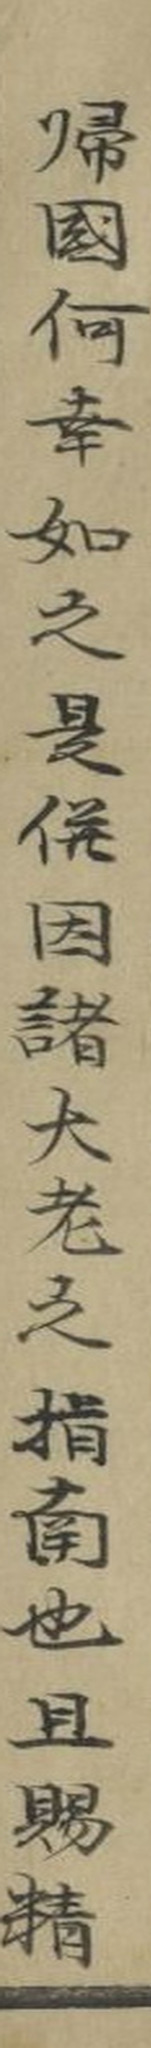帰国何幸如之是併因諸大老之指南也且賜精

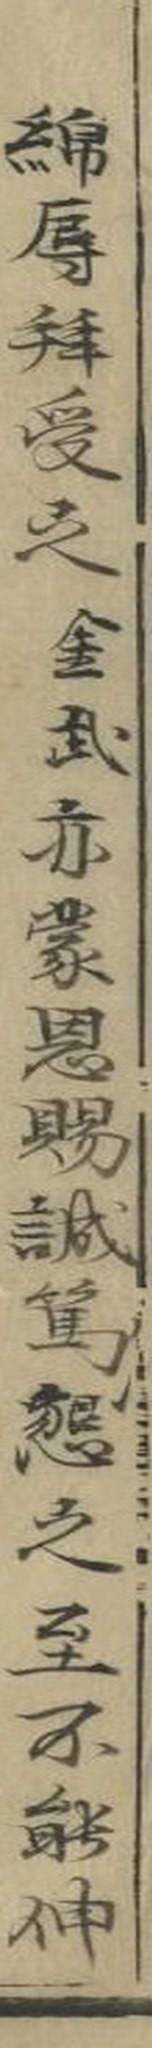綿辱拝受之金武亦蒙恩賜誠篤懇之至不能伸
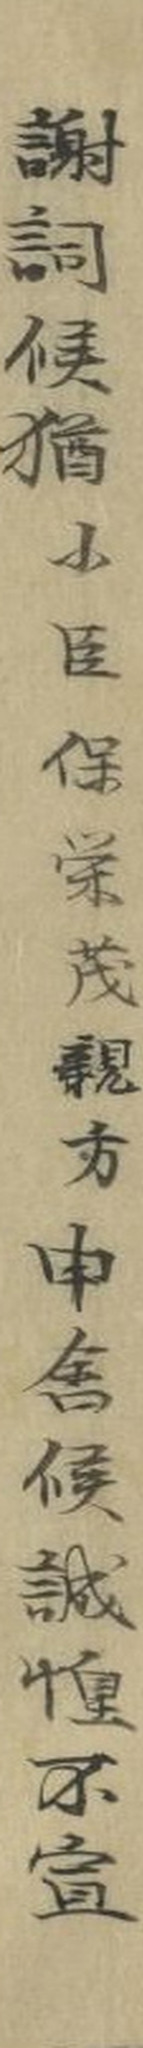謝詞候猶小臣保栄茂親方申含候誠惶不宣
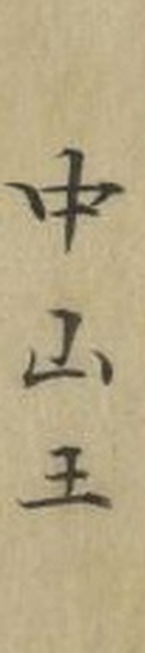中山王
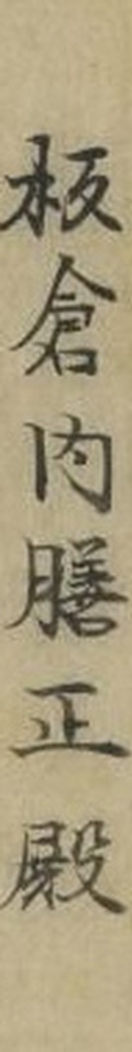板倉内膳正殿
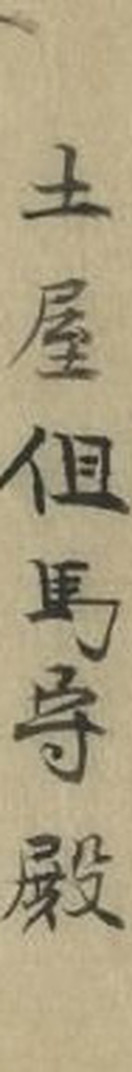土屋但馬守殿
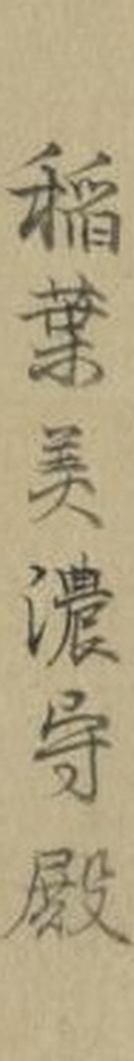稲葉美濃守殿
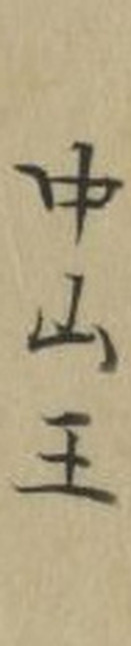中山王

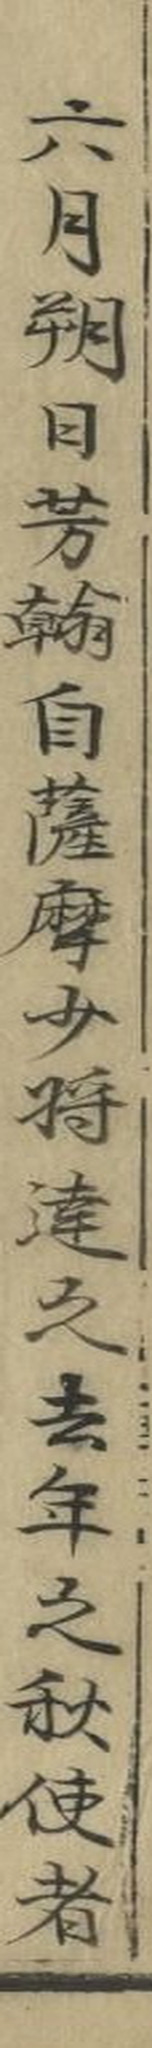六月朔日芳翰自薩摩少将達之去年之秋使者
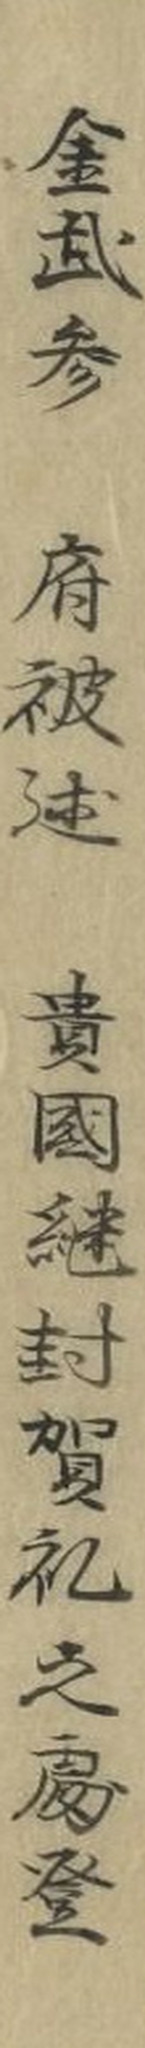金武参府被述貴国継封賀礼之處登
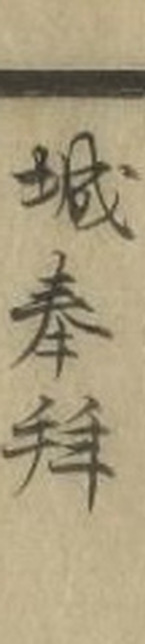城奉拝
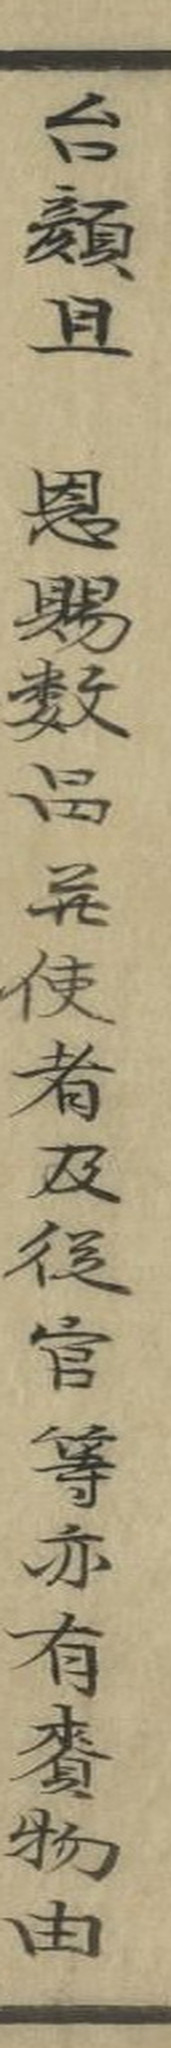台顔且恩賜数品并使者及従官等亦有賚物由
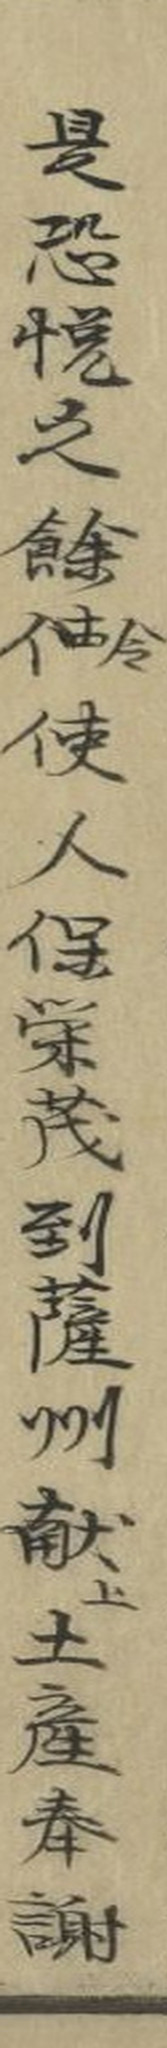是恐悦之余令使人保栄茂到薩州献上土産奉謝
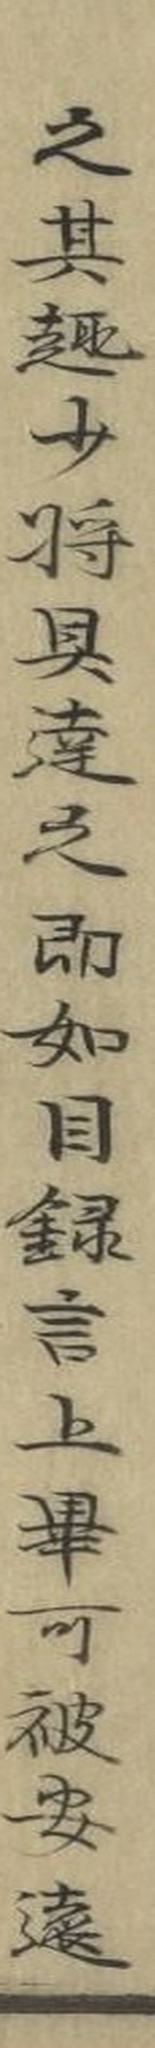之其趣少将具達之即如目録言上畢可被安遠
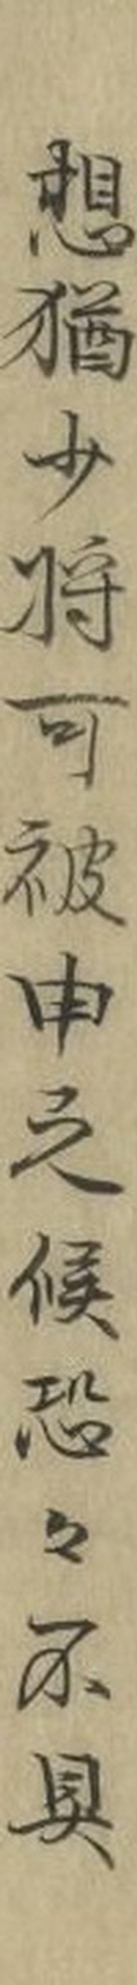想猶少将可被申之候恐々不具
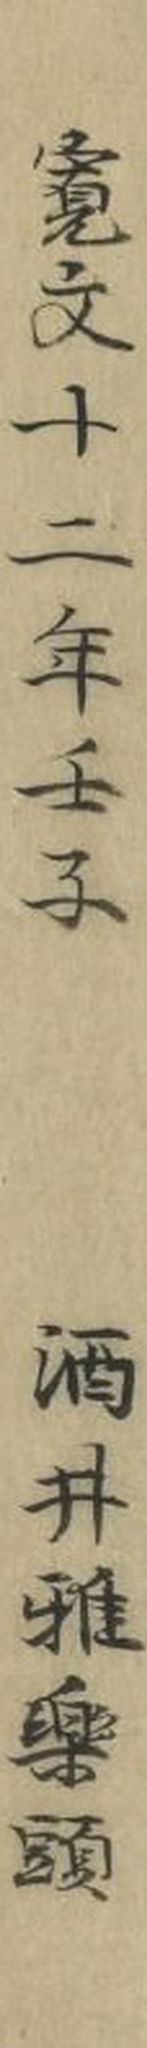寛文十二年壬子酒井雅楽頭
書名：琉球往来（下）
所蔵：University of the Ryukyus Library
